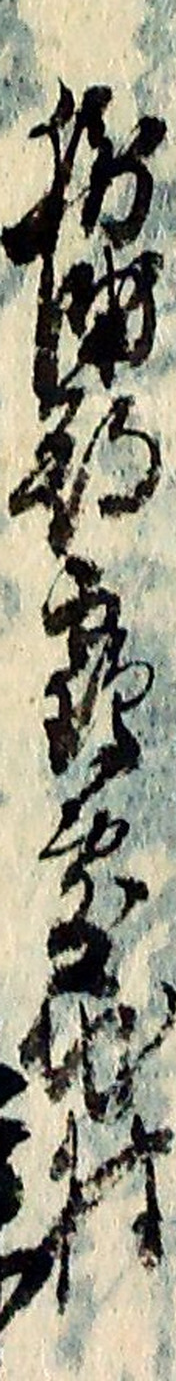勝浦郡鶴敷地村
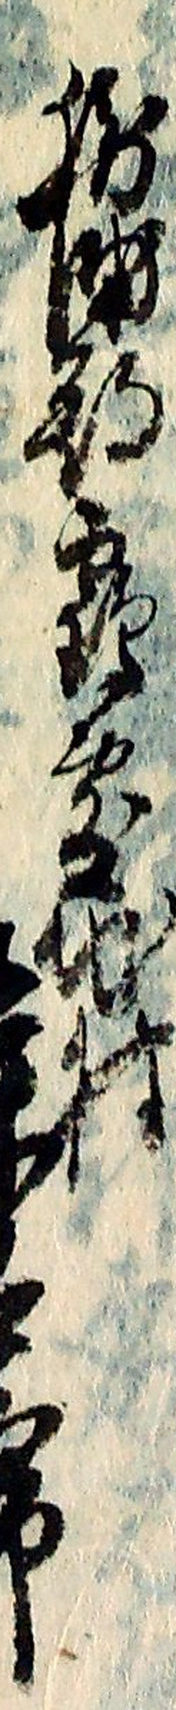勝浦郡鶴敷地村
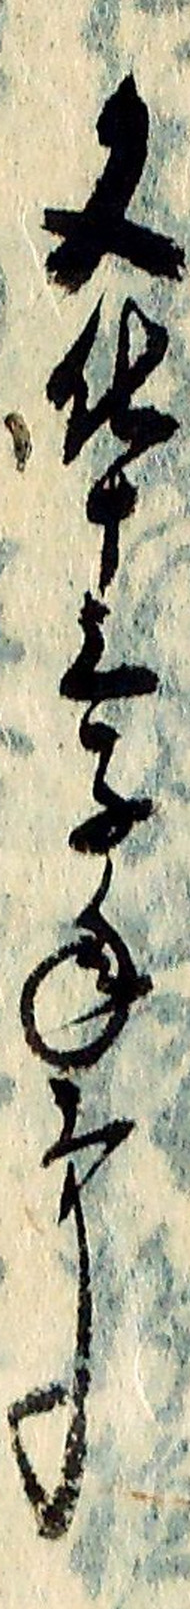文化十三子年三月
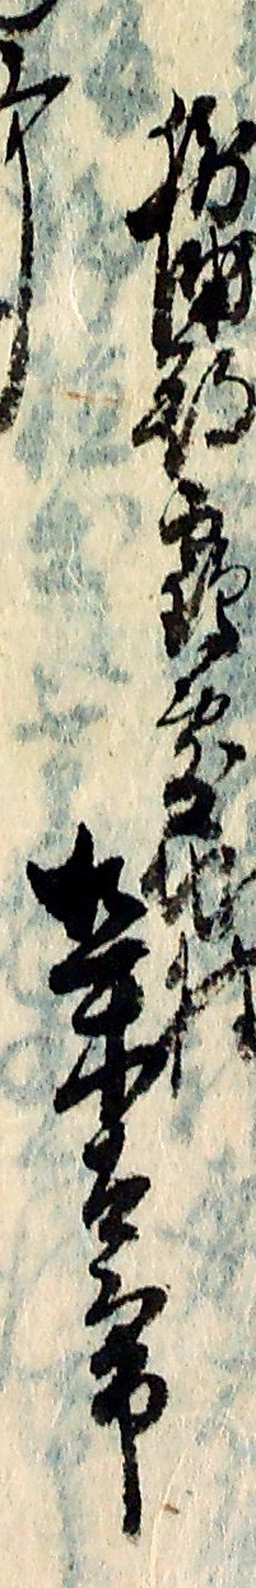栄太郎
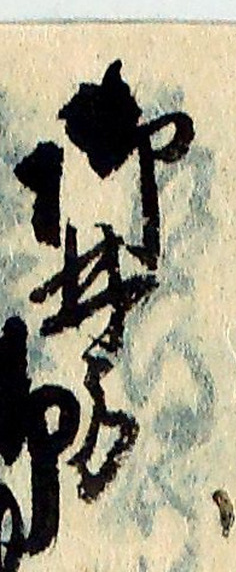御林方
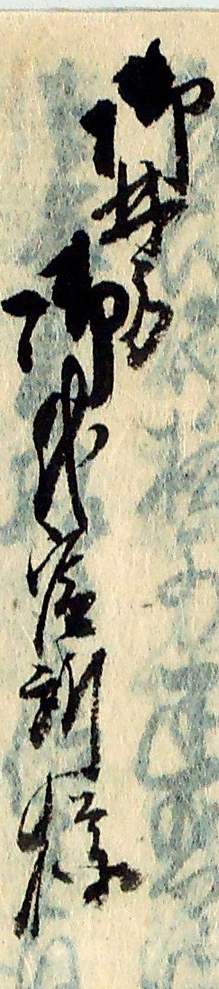御代官所様
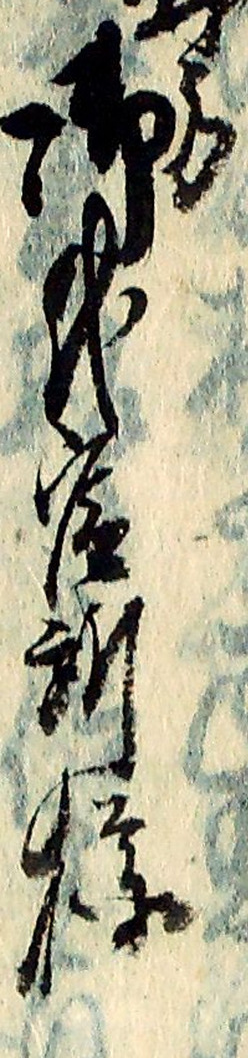御代官所様
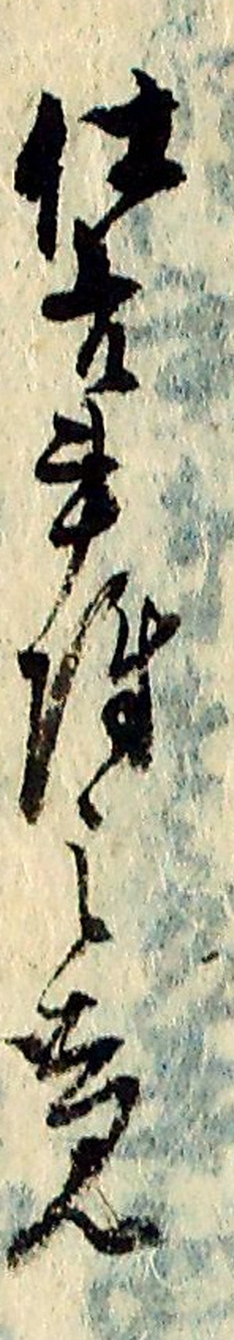仕上る書付之覚
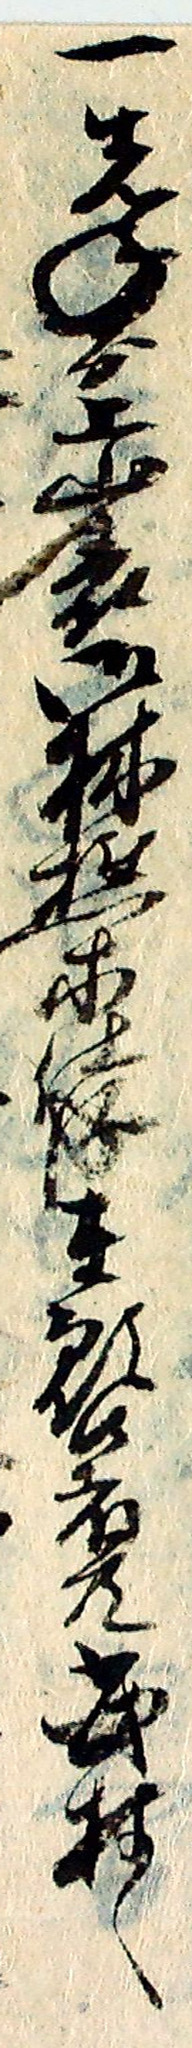一先年ゟ上山表御林樵木仕儀奉願候者共当村へ
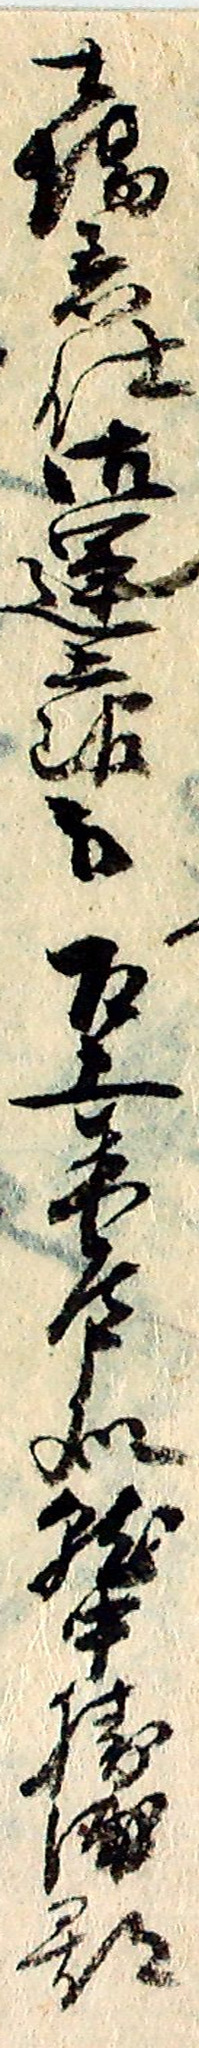土場着仕御運上銀被召上来居申処就中勝浦郡
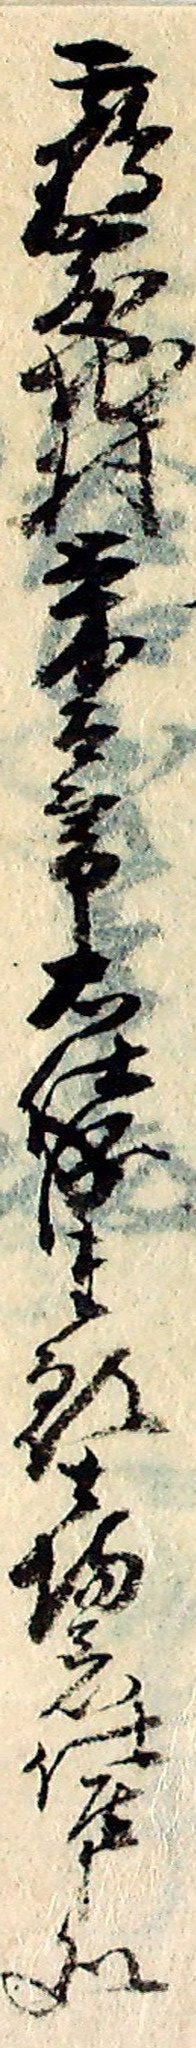鶴敷地村栄太郎右仕成奉願土場着仕居申処
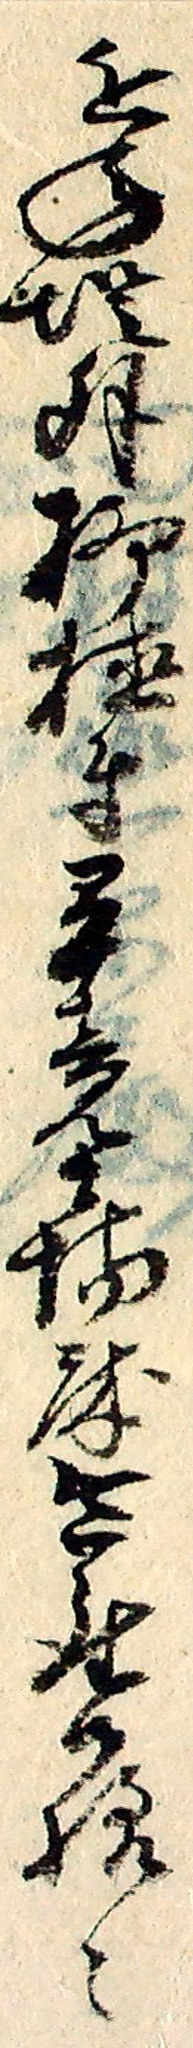近年堤外柳植付畢竟土場床無御座候様に
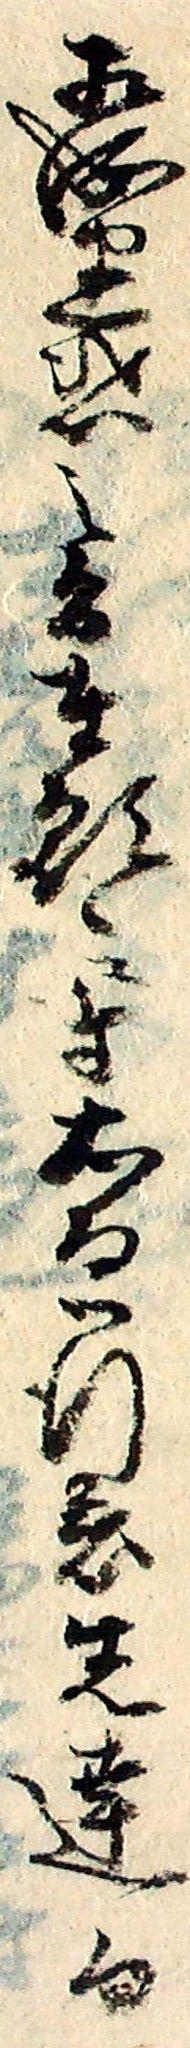相成迷惑之旨奉願候に付右為御行着先達て
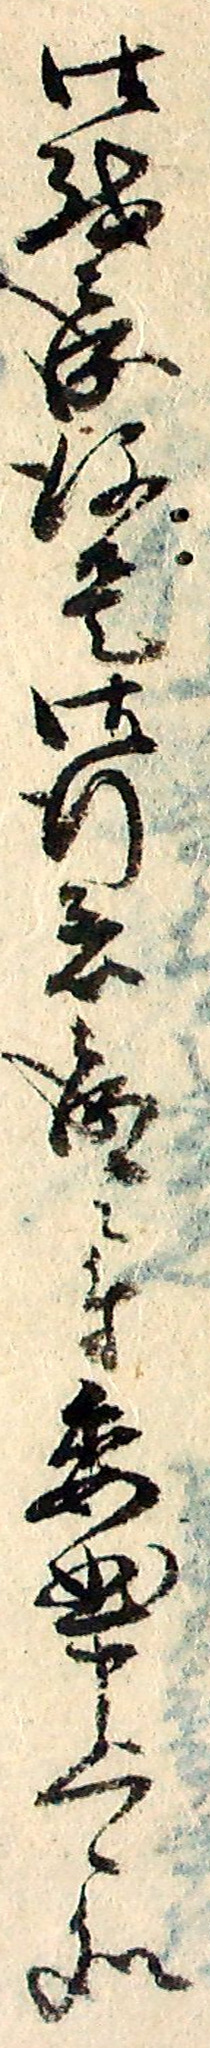御越被成後是御行着被成候に付委曲申上候処
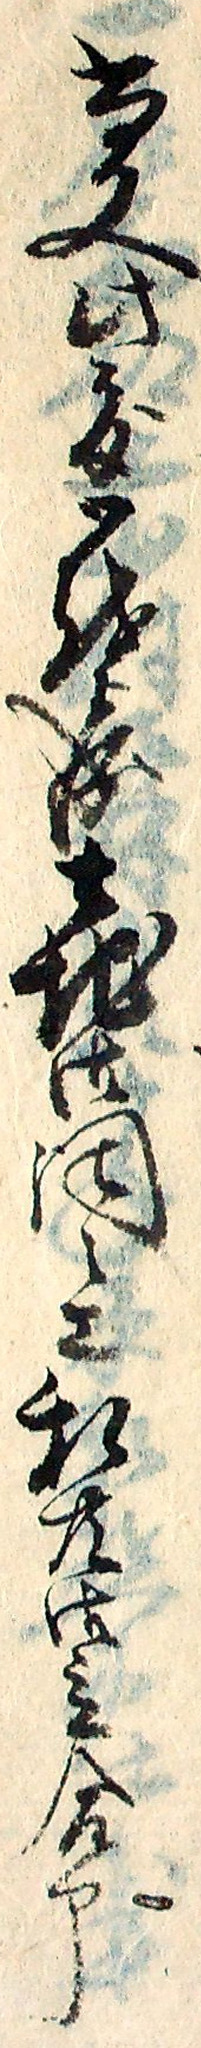尚又此度御越被成土地御調之上私共御立合申

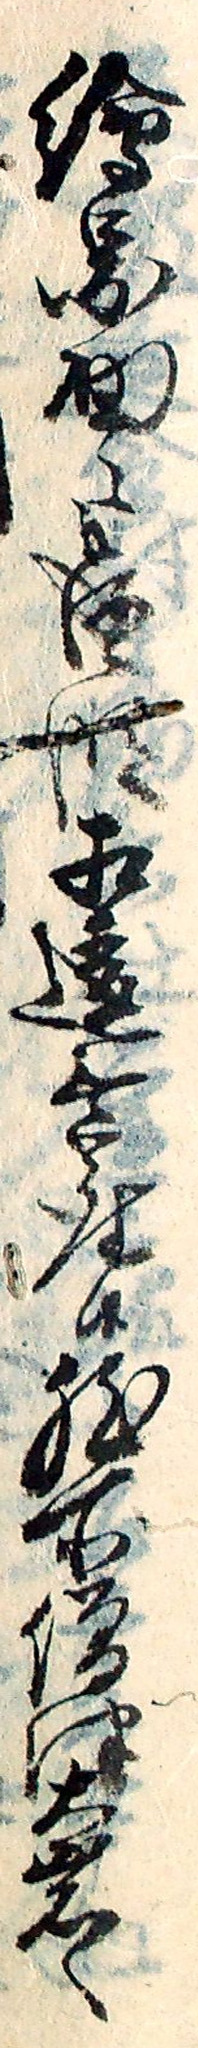絵図面に被成候段相違無御座候然所僧津大岩へ
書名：諸御願書控(後藤氏壱番）
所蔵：鳴門教育大学 Naruto University of Education
